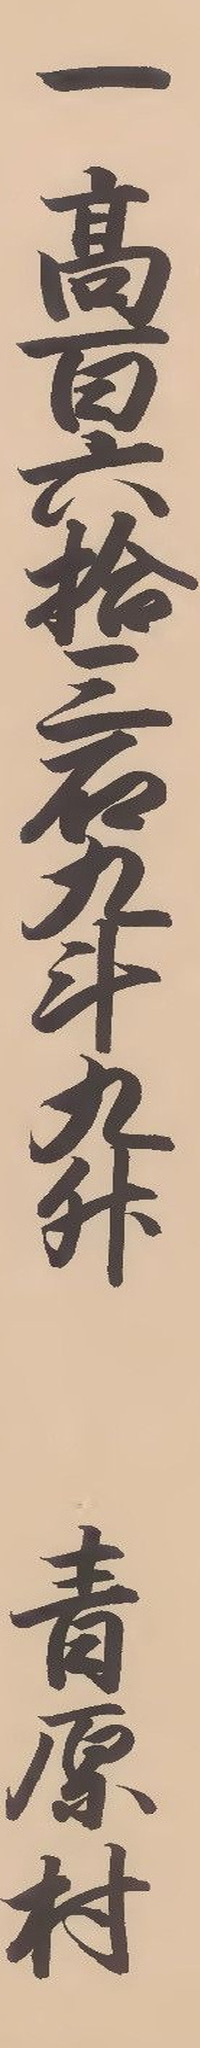一髙百六拾三石九斗九升青原村
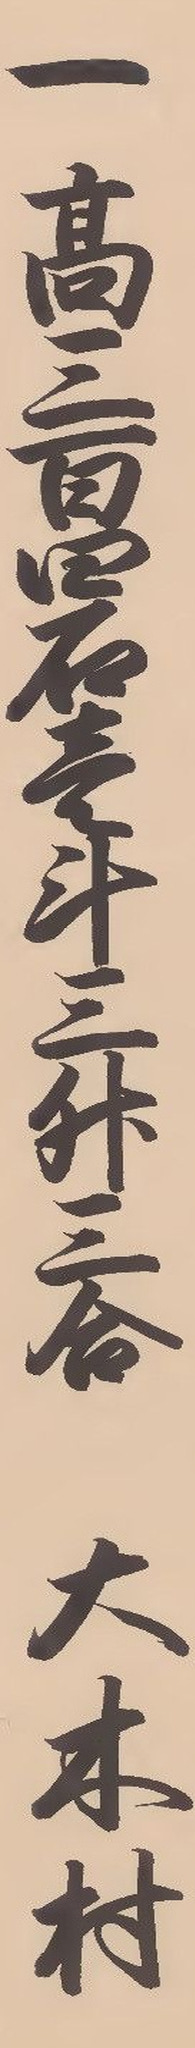一髙三百四石壱斗三升三合大木村
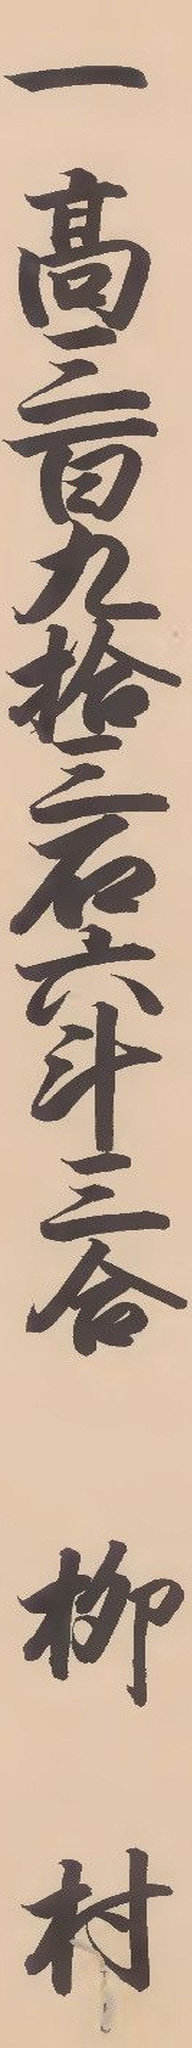一髙三百九拾三石六斗三合柳村
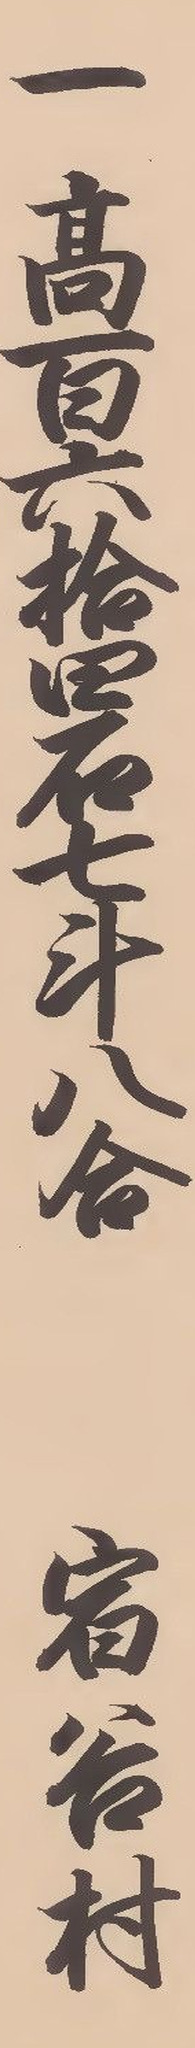一髙百六拾四石七斗八合宿谷村
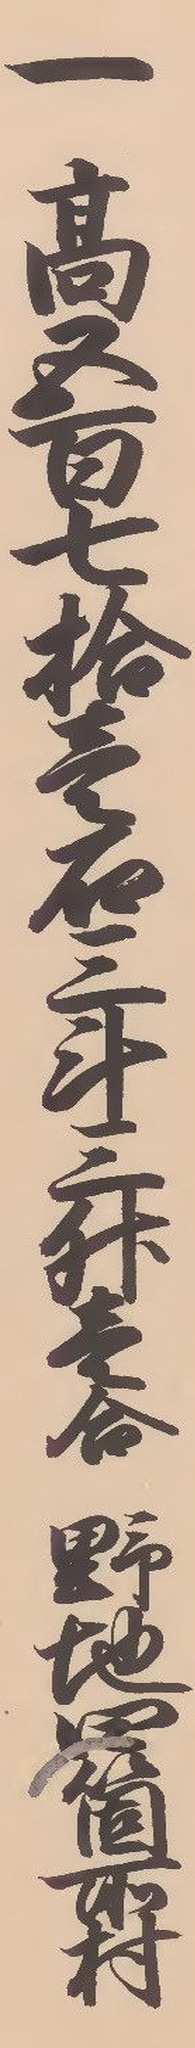一髙五百七拾壱石三斗三升壱合野地四箇所村

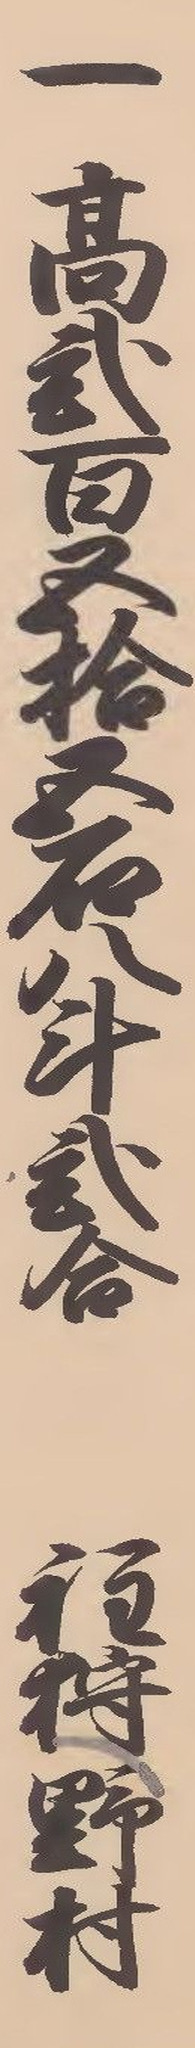一髙弐百五拾五石八斗弐合程狩野村
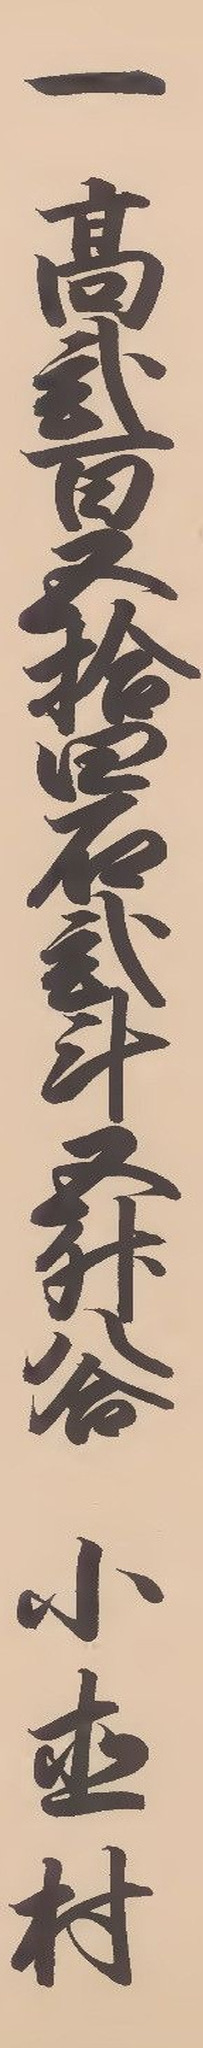一髙弐百五拾四石弐斗五升八合小直村
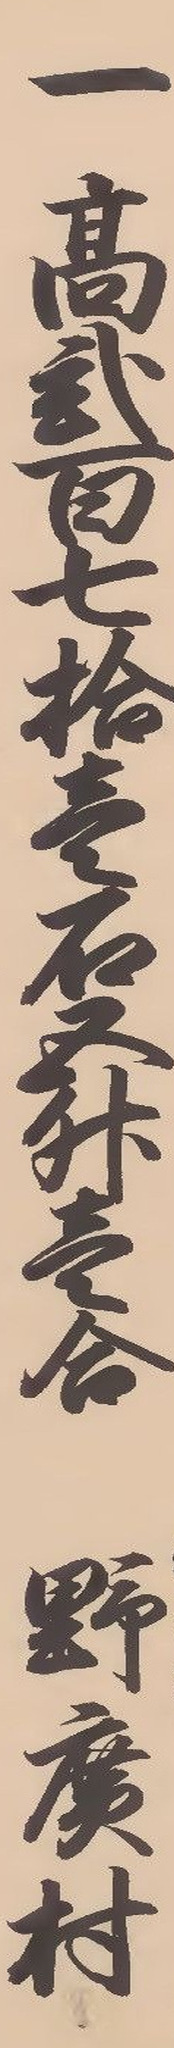一髙弐百七拾壱石五升壱合野廣村
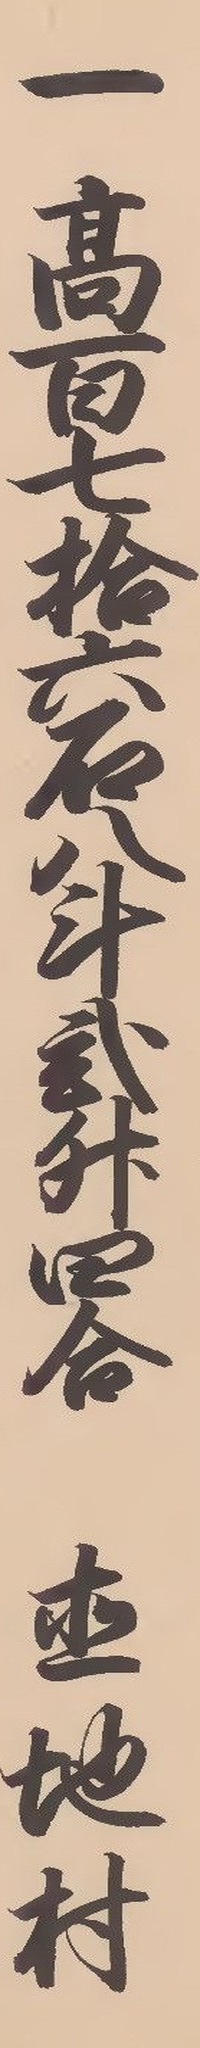一髙百七拾六石八斗弐升四合直地村
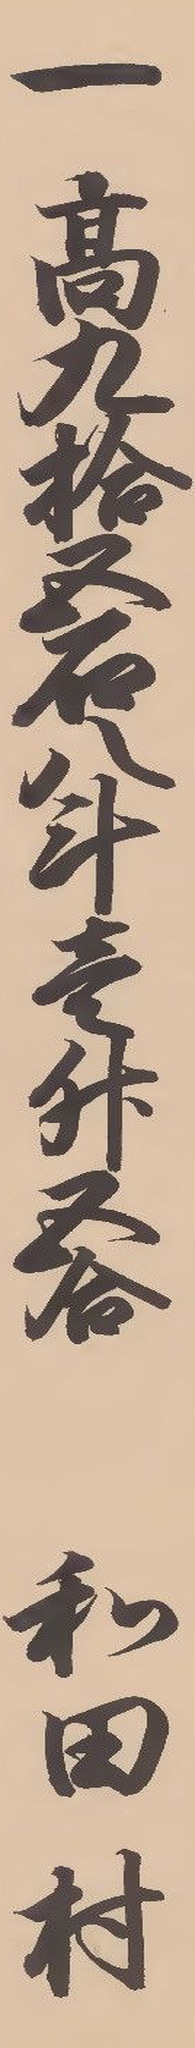一髙九拾五石八斗壱升五合和田村
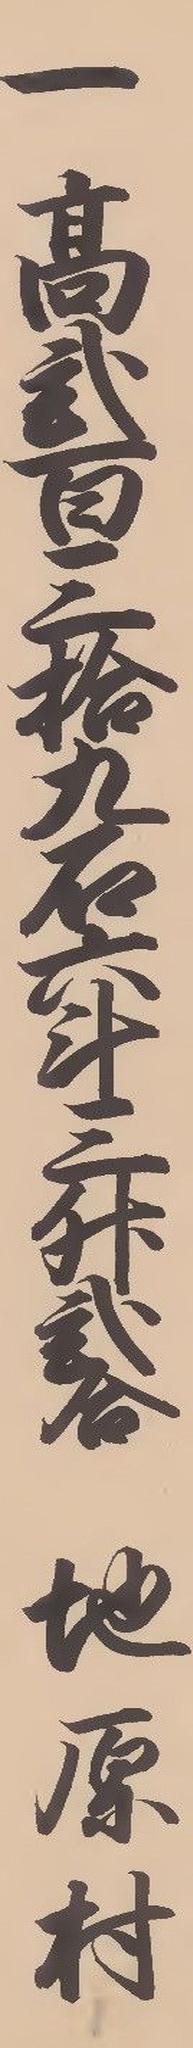一髙弐百三拾九石六斗三升弐合地原村
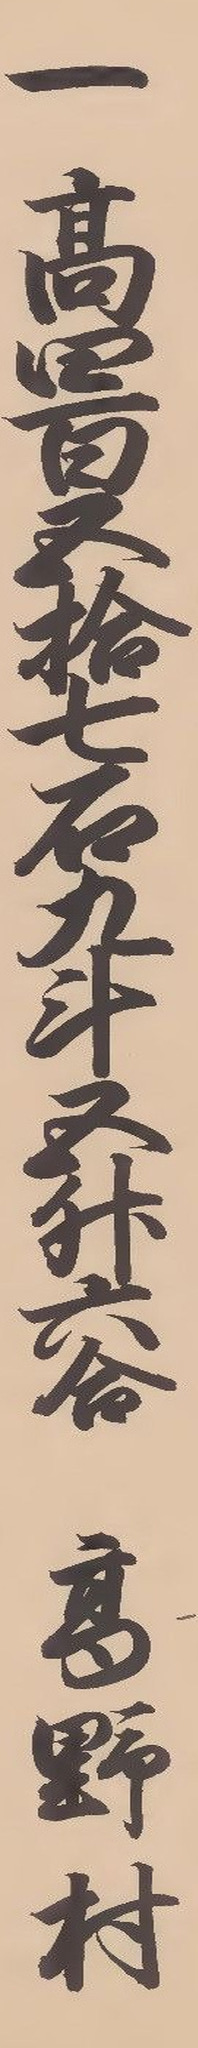一髙四百五拾七石九斗五升六合髙野村
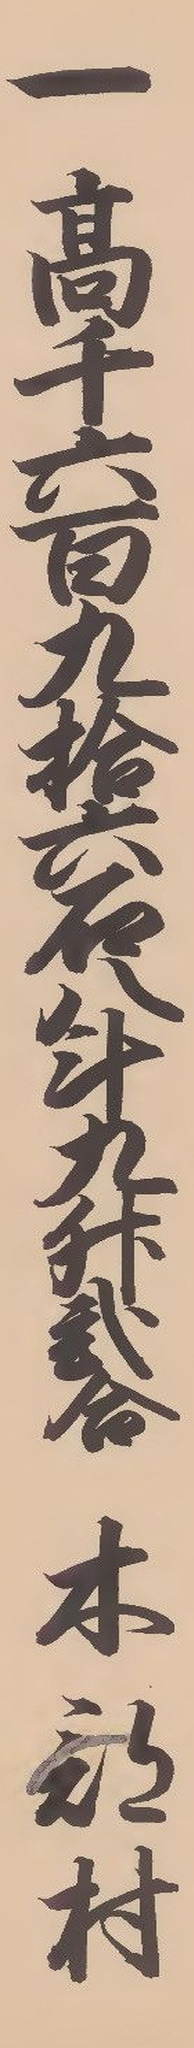一髙千六百九拾六石八斗九升弐合木部村

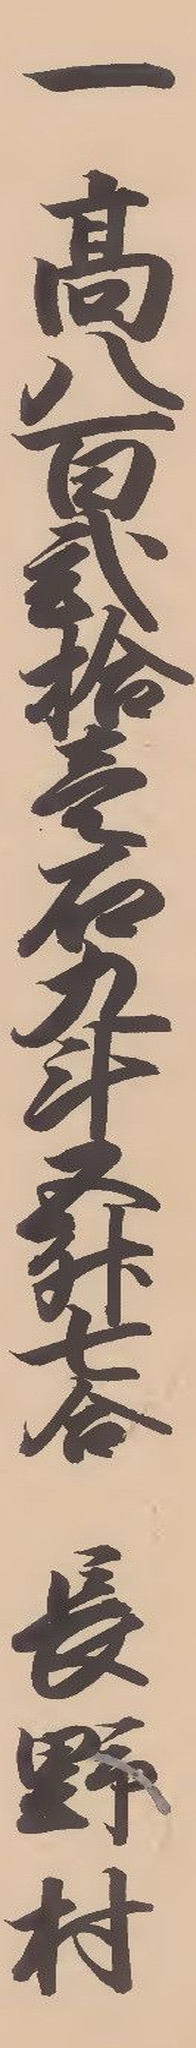一髙八百弐拾壱石九斗五升七合長野村
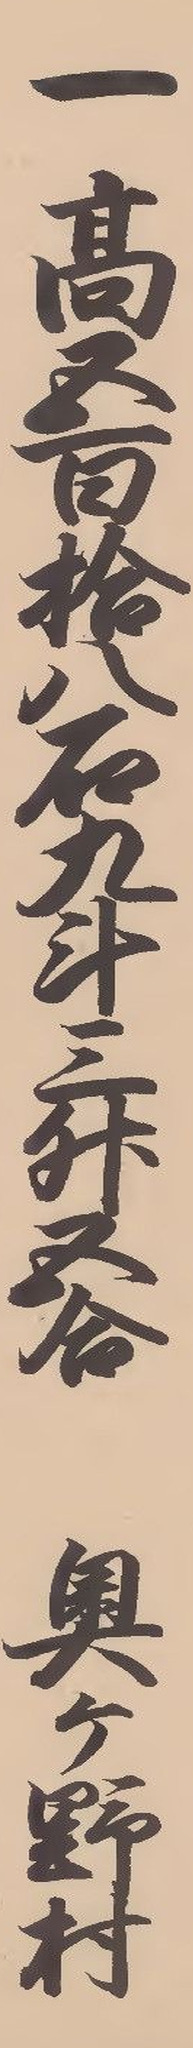一髙五百拾八石九斗三升五合奥ケ野村
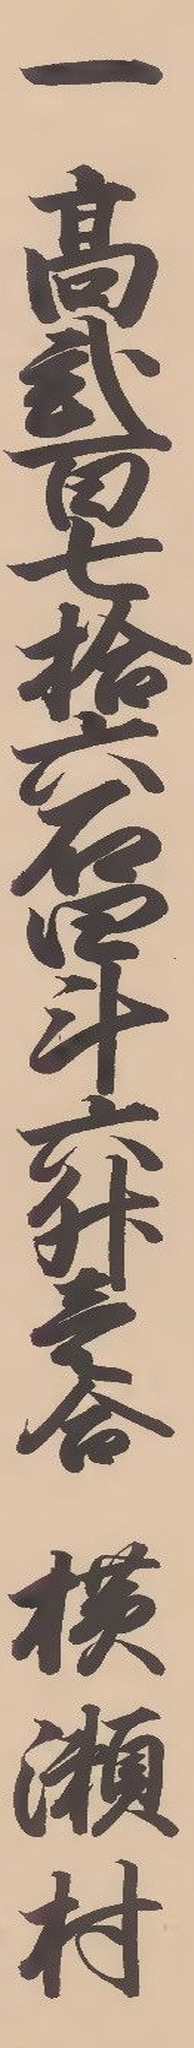一髙弐百七拾六石四斗六升壱合横瀬村
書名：石見国郷帳
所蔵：国立公文書館 National Archives of Japan
